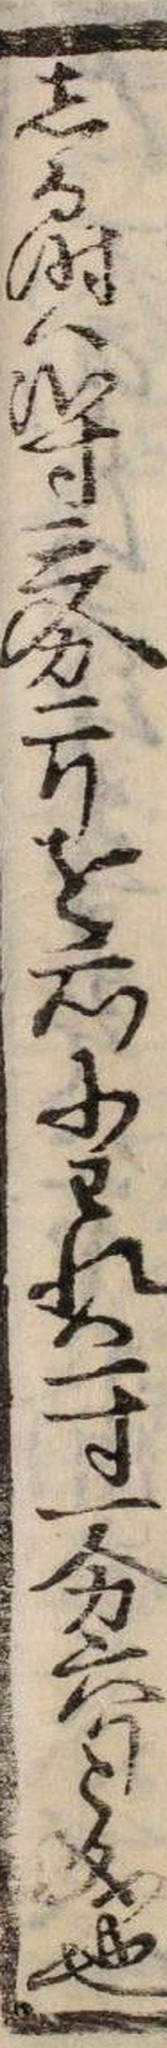しる時は弐寸三分二りを取にわれは一寸一分六りと成也
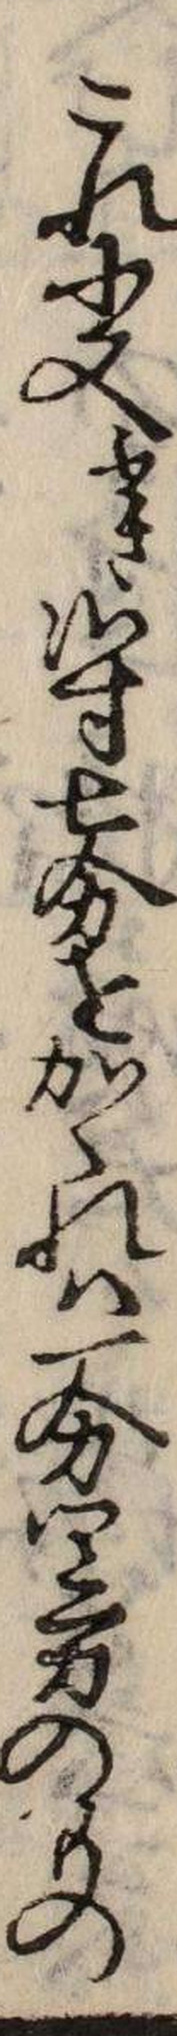これに又ふかさ弐寸七分をかくれは一分四方のもの
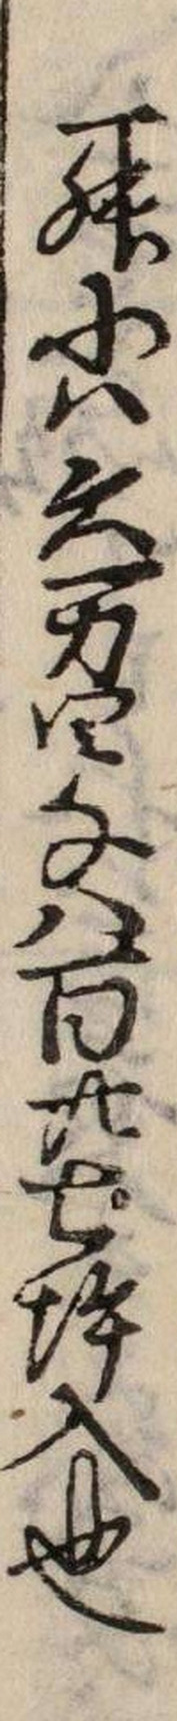一升には六万四千八百廿七坪入也
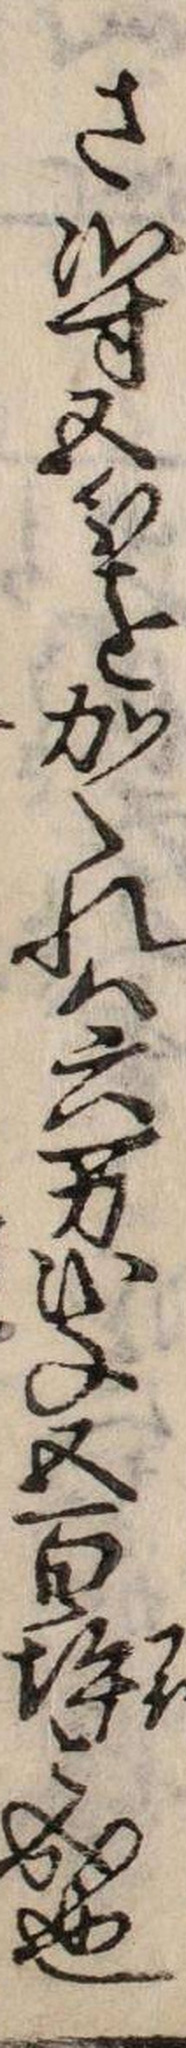さ弐寸五分をかくれは六万弐千五百坪と成也
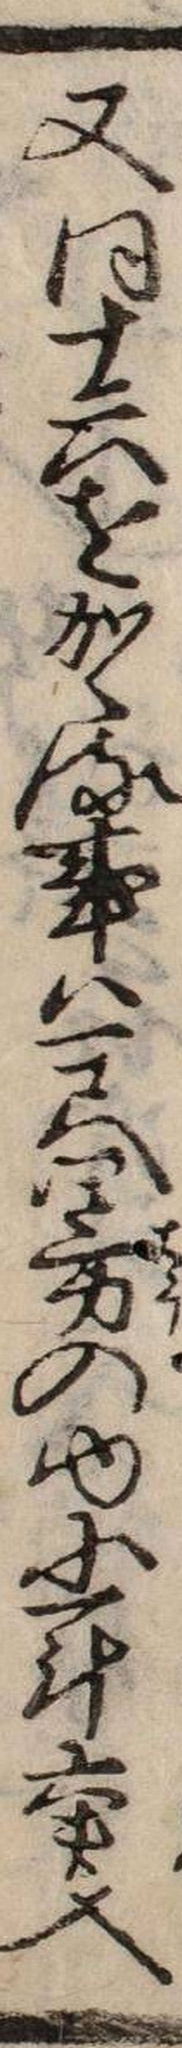又同十六をかくる事は一尺四方の内に一斗六升入
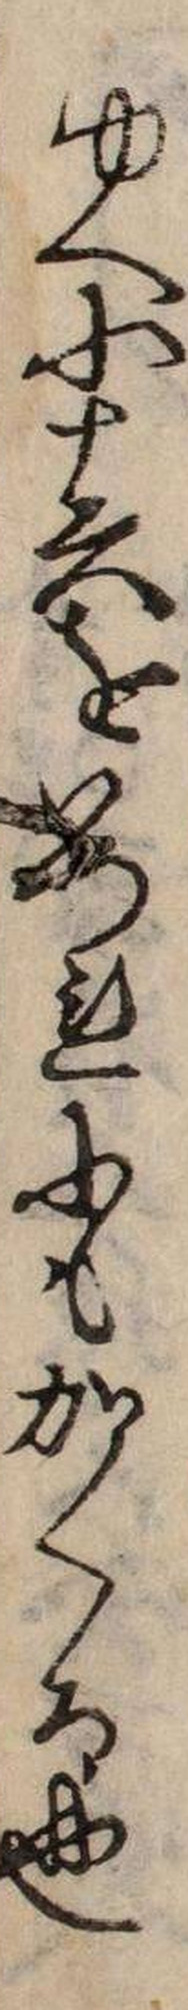ゆへに十六をいつれにもかくる也

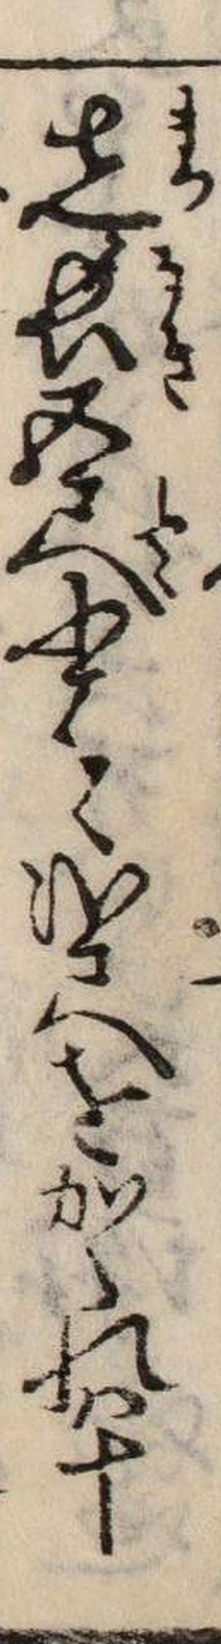先長五尺にはは弐尺をかくれは十
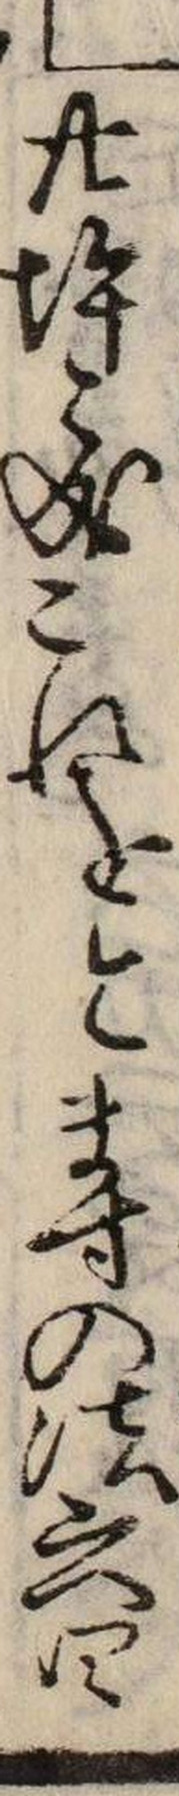坪と成これをことますの法六四
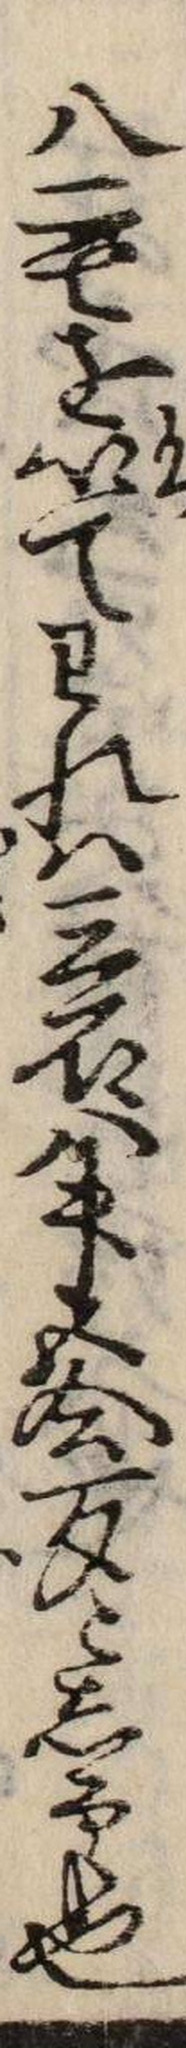八二毛を以てわれは三石八升五合一夕としるる也
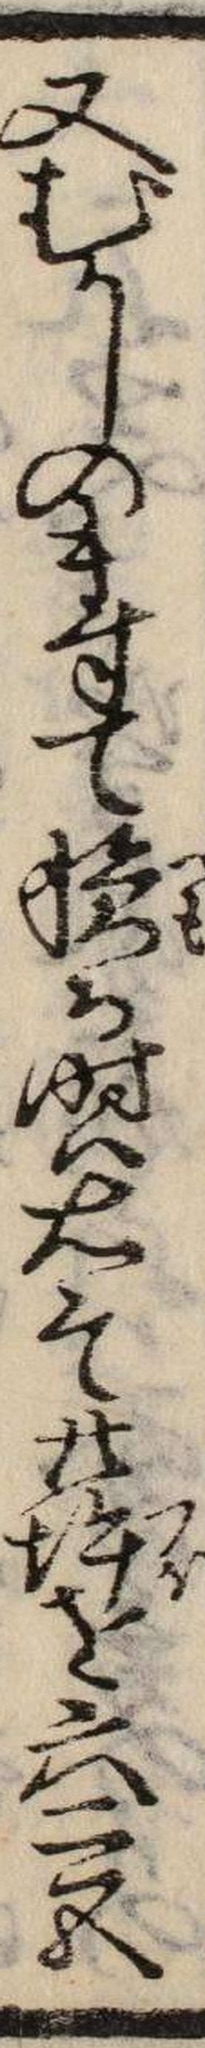又むかしのますて積る時は右にて廿坪を六二五
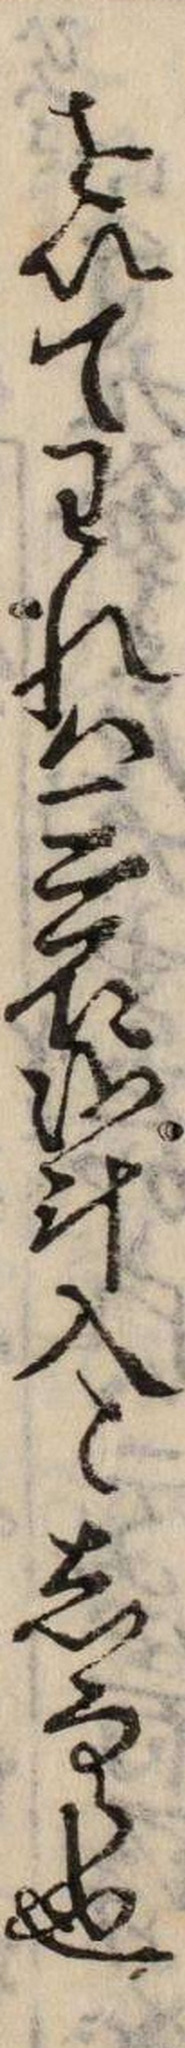を以てわれは三石弐斗入としるる也
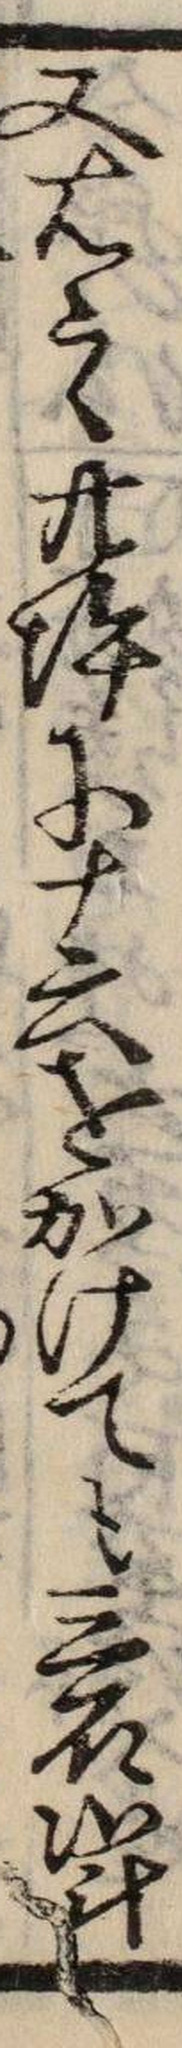又右之廿坪に十六をかけても三石弐斗
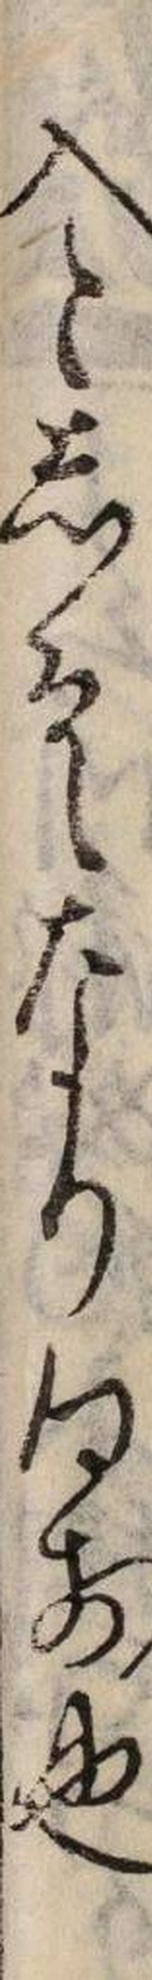入としるるなり同前也
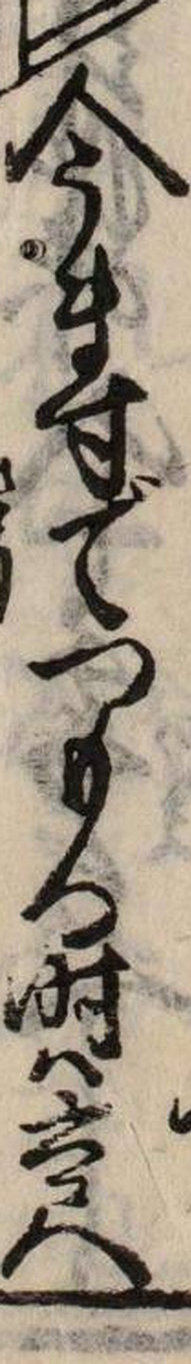今ますてつもる時は六尺
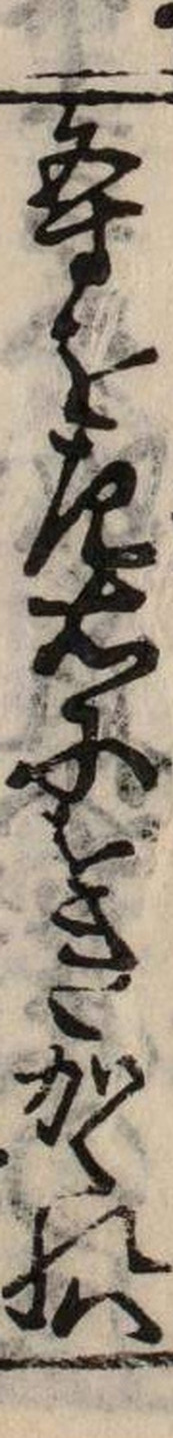五寸を左右にをきかくれは
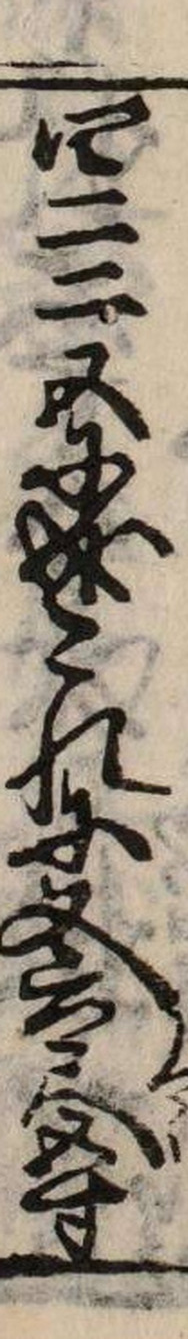四二二五に成これに又六尺五寸
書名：塵劫記（寛永11年自跋、京都府立京都学・歴彩館追貴8）
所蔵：京都府立京都学・歴彩館 国文学研究資料館
